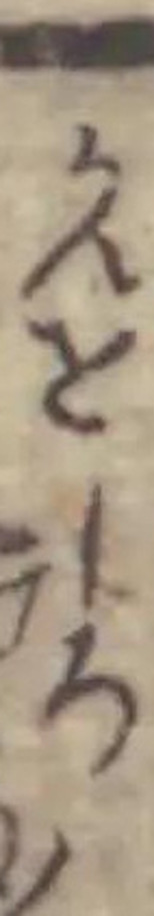かんをしろ
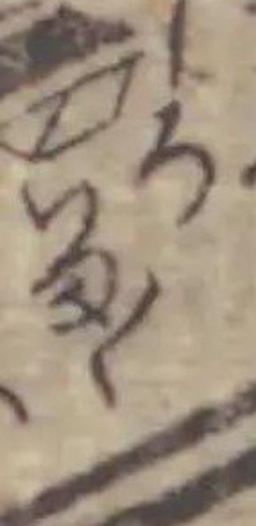いま〳〵
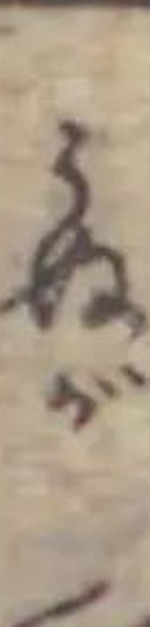うぬが
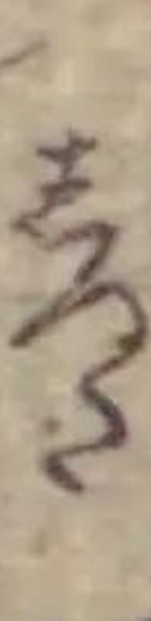しつた
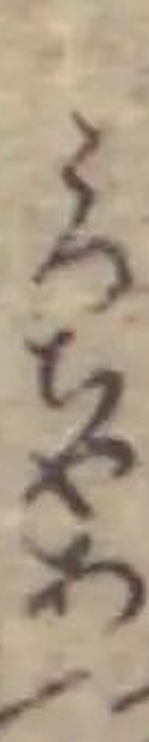こつちやあ
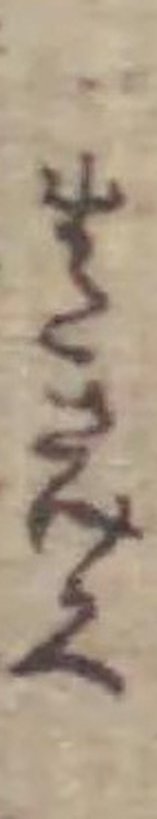またさけかへ
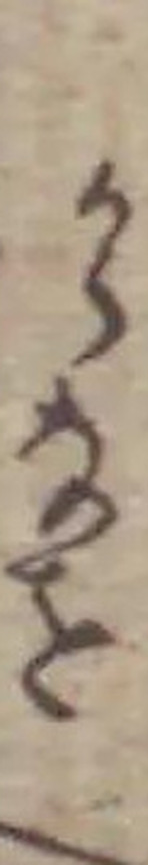からなを
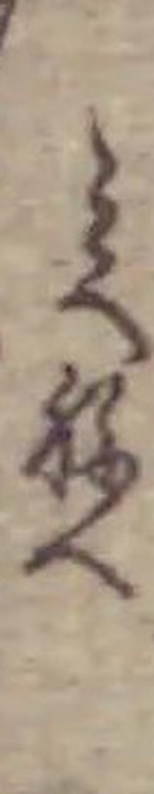みへねへ
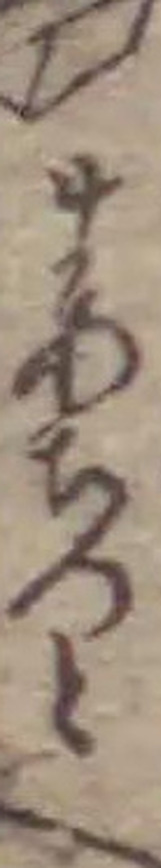まあちつと
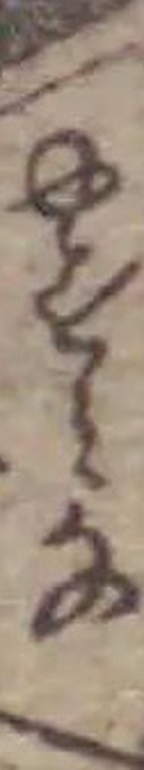やすみな
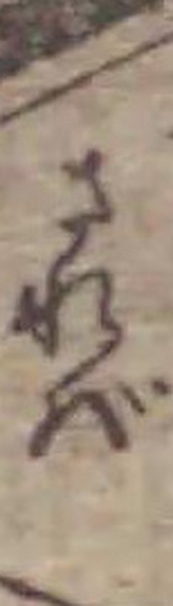されば

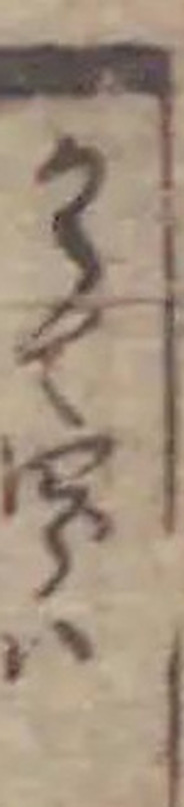かくて四郎は
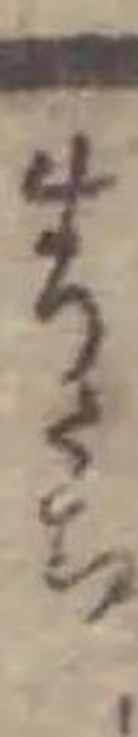まりたち
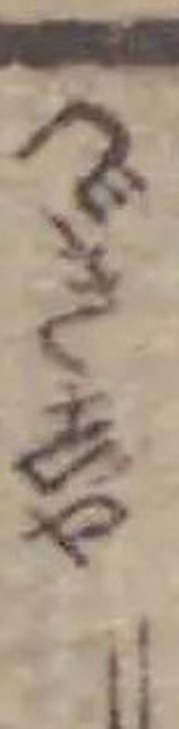つゞきしや
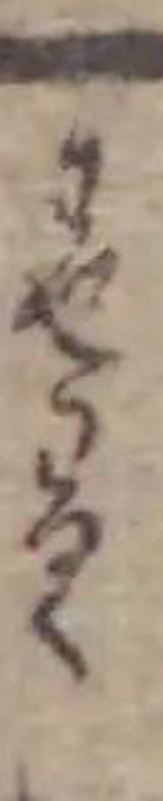わせわるく
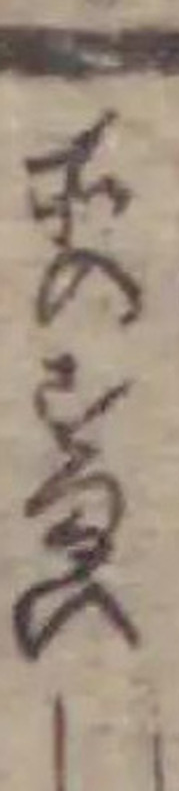所のすまい
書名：奥州咄 3巻
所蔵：国立国会図書館 National Diet Library, JAPAN
